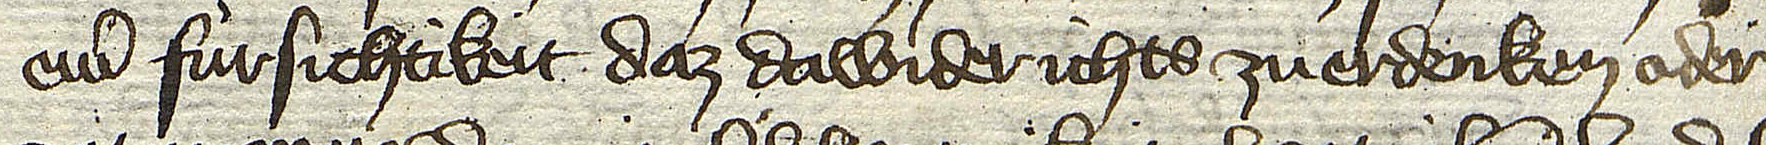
ew* fürſichtikeit daʒ dawider ichts cʒu erdenken oder
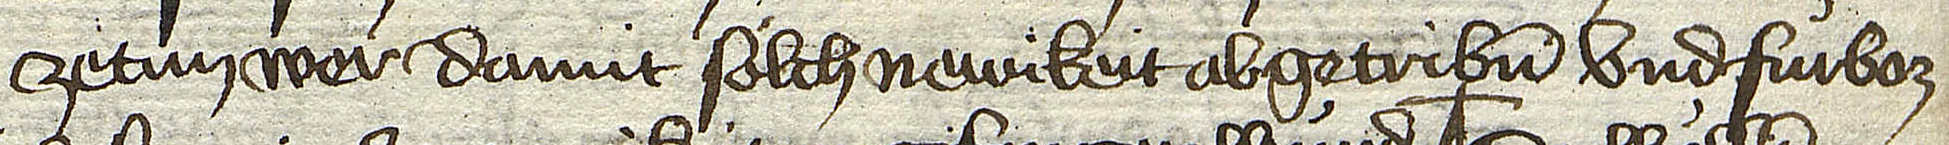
cʒetun wer / damit ſölch newikeit abgetrib*n vnd fürbaʒ
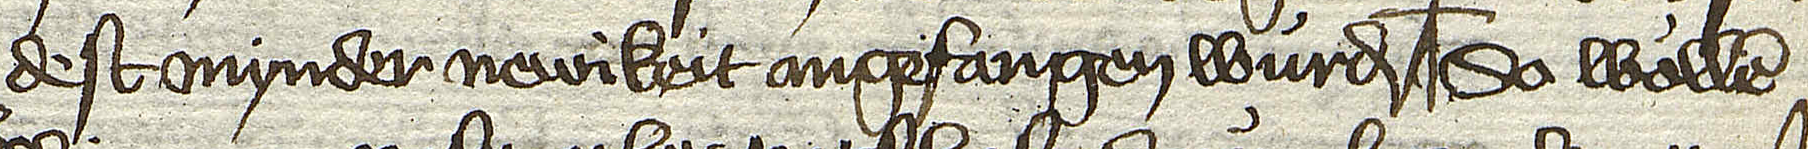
deſt mynder newikeit angefangen würd* So wölle*
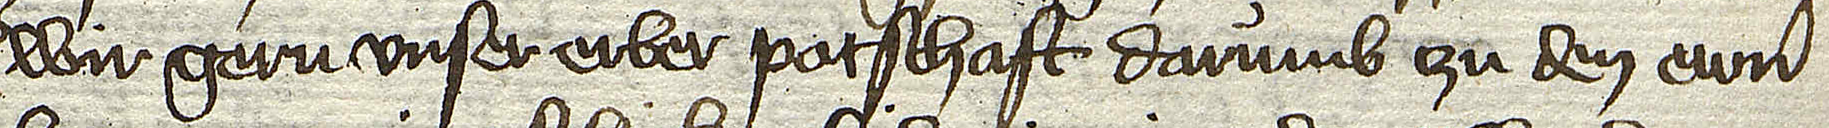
wir gern vnſer erber potſchaft darümb cʒu den ew*n
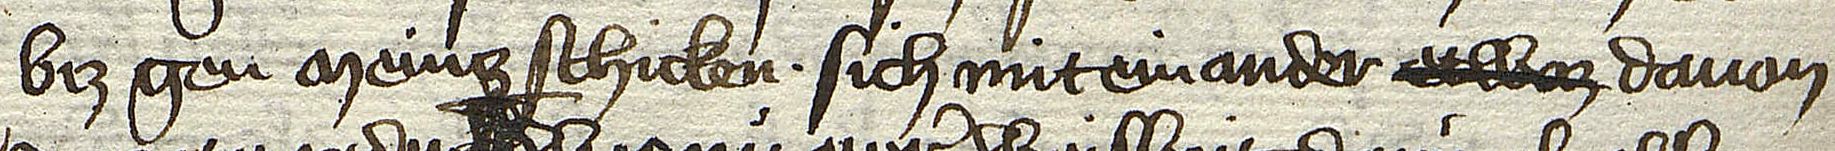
biʒ gen Meincʒ ſchicken . ſich mit einander etwaʒ dauon
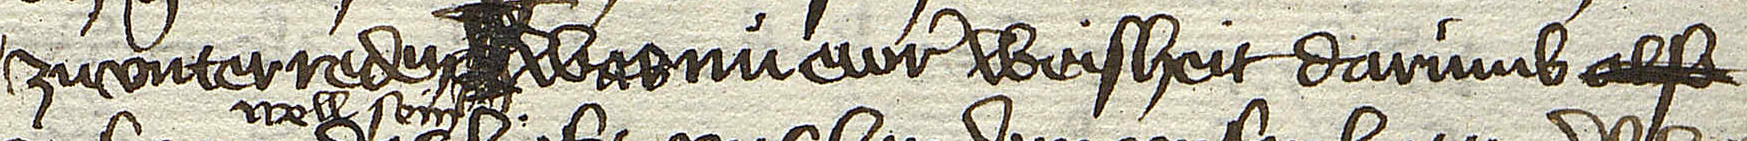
cʒu vnter reden was nü ewr* weiſheit darümb alſo
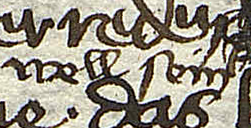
well ſein
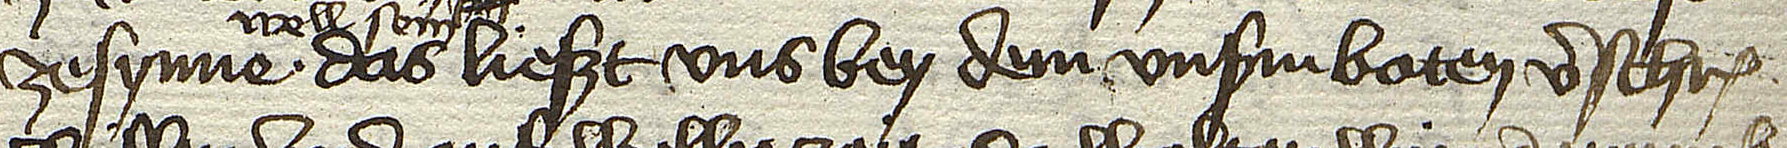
cʒeſynne . das lieſʒt vns bey den vnſ*m boten v*ſchr*
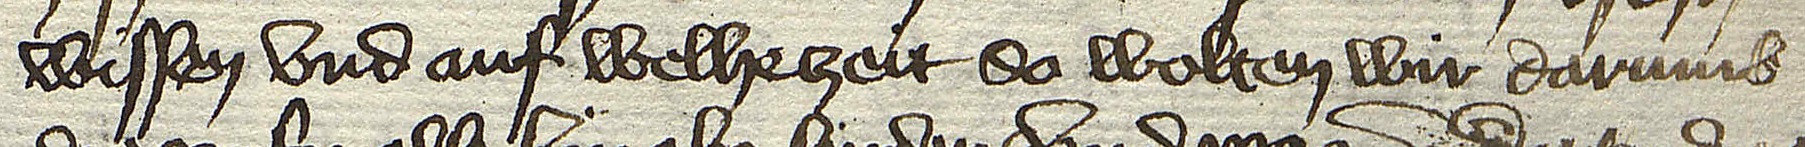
wiſſen vnd auf welhe cʒeit So wolten wir darumb
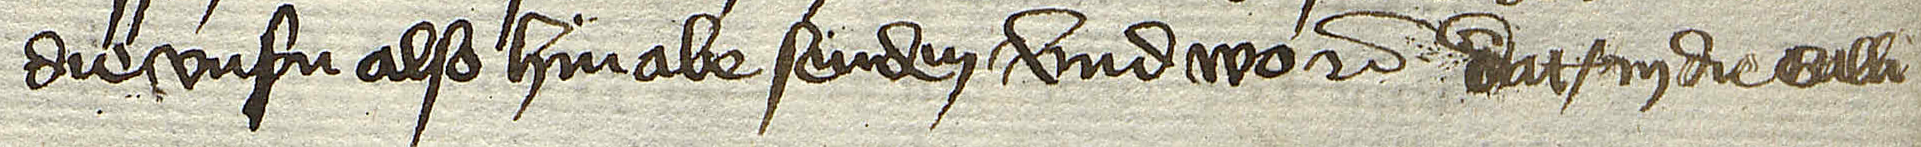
die vnſ*n alſo hin abe ſenden / Vnd wo ec* dat* in die Galli
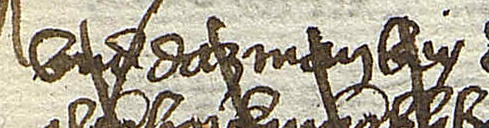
vnd daʒ man bey
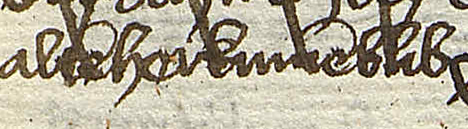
alte* herkume* blib
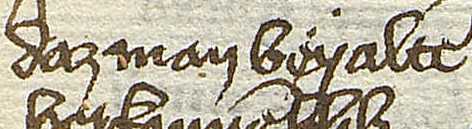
daʒ man bey alte*
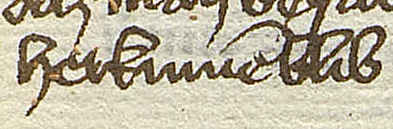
herkume* blib
